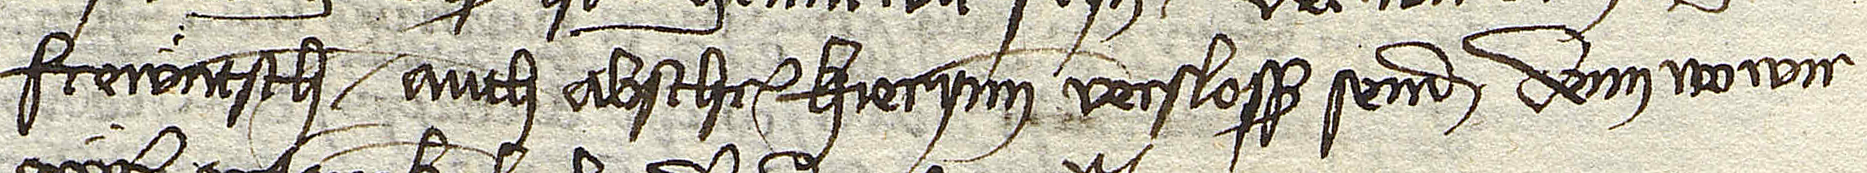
frewntſch* / auch abſchr* hierynn* verſloſſ* ſend* Denn wo wir
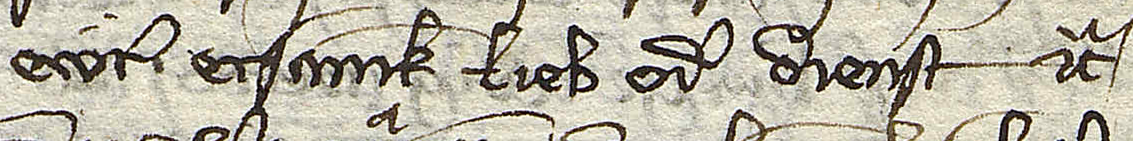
ew*r erſamk* lieb od* dienſt ec*
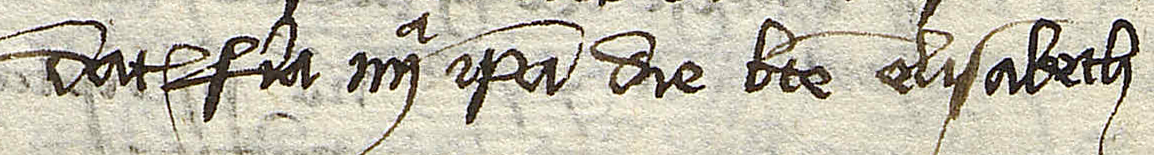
Dat* fia* iiii* ipa* die b*te eliſabeth
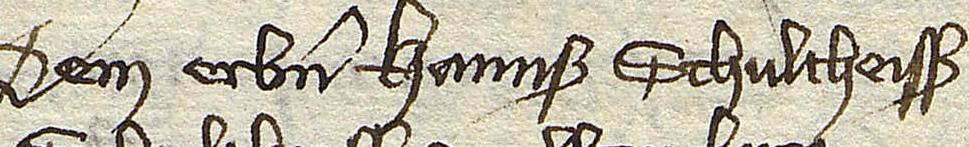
Dem erb*n hannſ* Schultheiſſ*
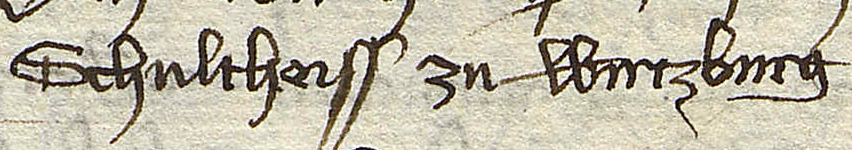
Schultheiſſ ʒu Wircʒburg
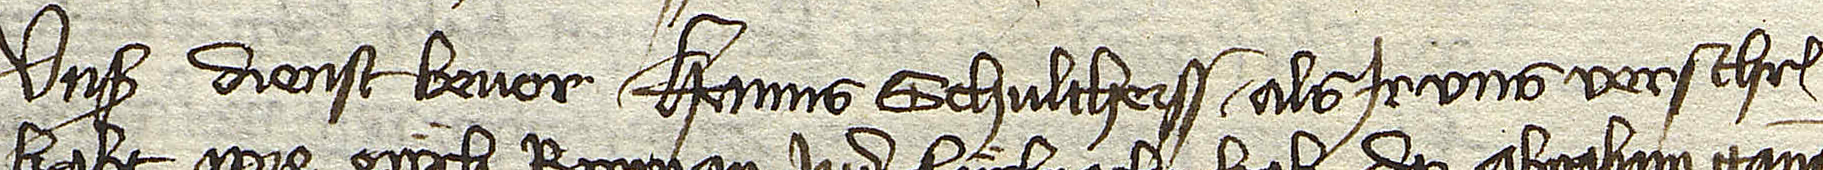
Vnſ* dienſt beuor Hanns Schultheiſſ / als Ir vns verſchr*
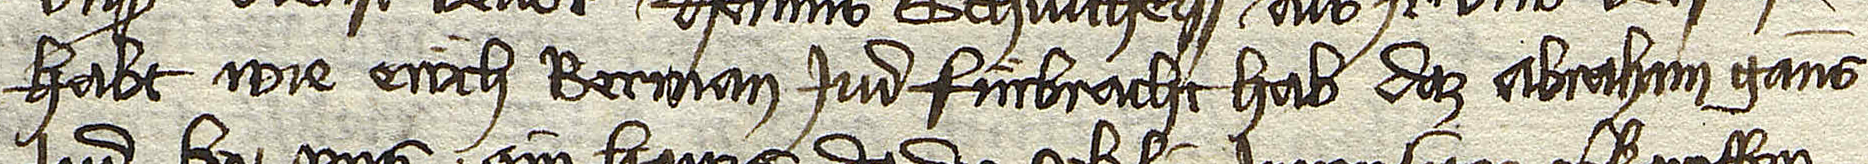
habt wie ewch Berman Iud fürbracht hab daʒ abraham gans*
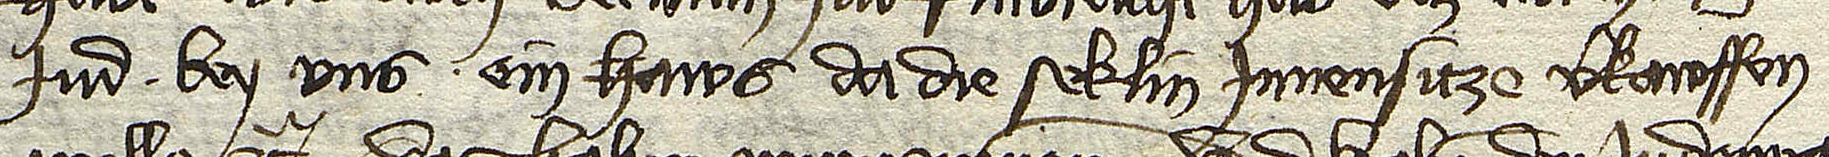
Iud . bey vns . ein haws da die ſeklin Innenſicʒe v*kawffen
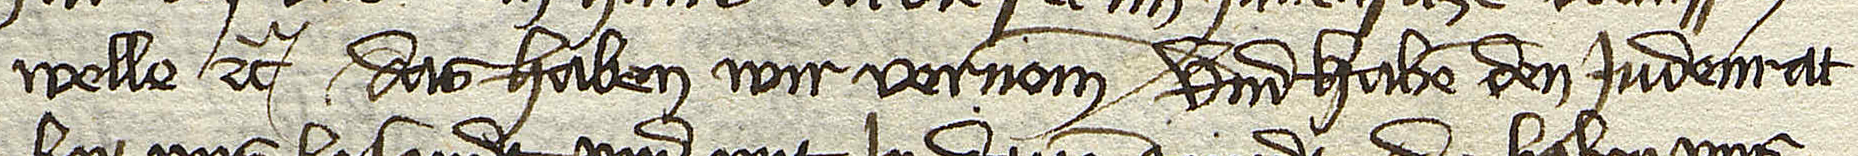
welle ec* / das haben wir vernom* / Vnd habe* den Iudenrat
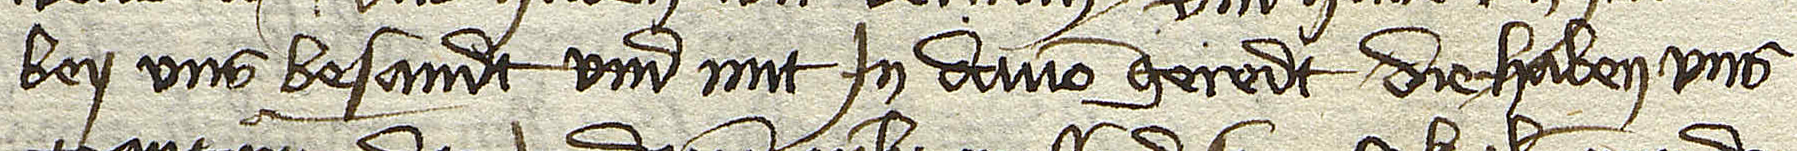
bey vns beſandt vnd mit In dauo* geredt / die haben vns
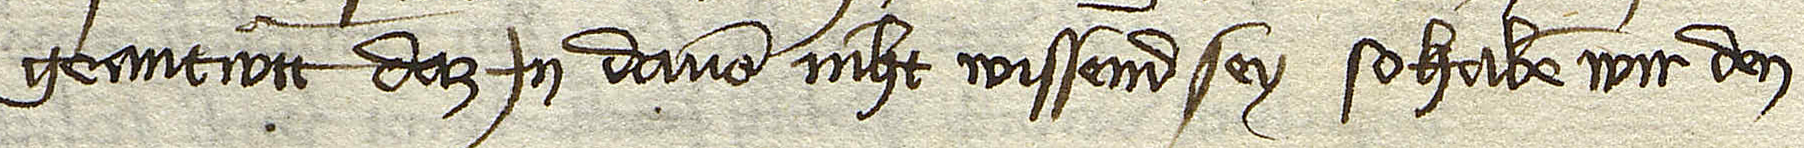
geantw*tt daʒ In dauo* niht wiſſend ſey ſo habe* wir den
